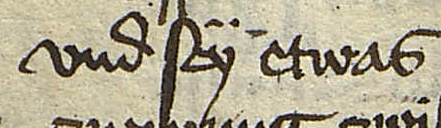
vnd ſey etwas
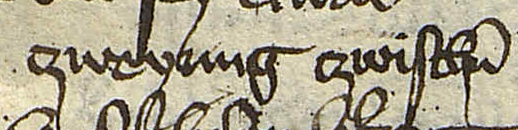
cʒweyung cʒwiſchn*
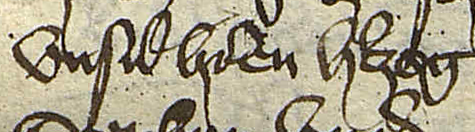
vnſ*n hr*en h*cʒog
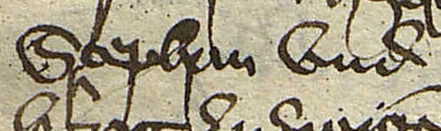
Stephan vnd
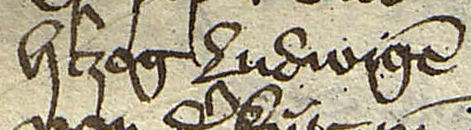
h*cʒog Ludwige*
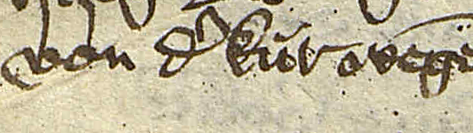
von d* kür wege*
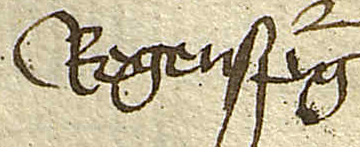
Regenſpg*
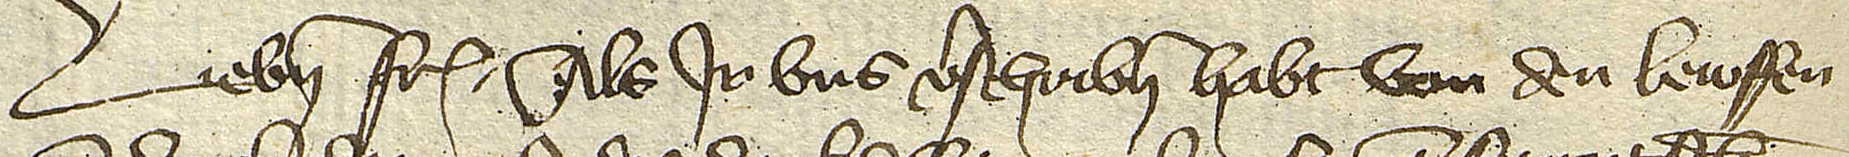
Liebn* fr* / Als Ir vns v*ſchribn* habt von den lewffen
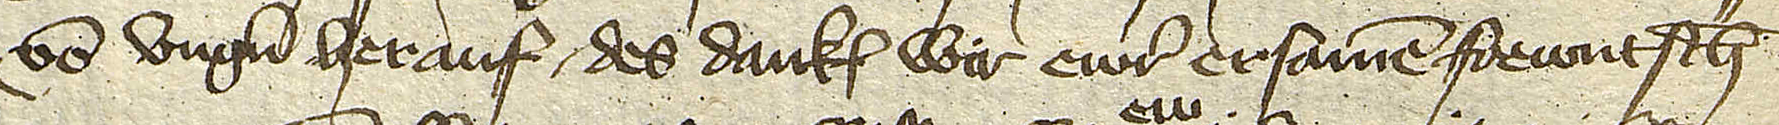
vo* vngn* herauf / des dank* wir ewr* erſame* frewntſch*
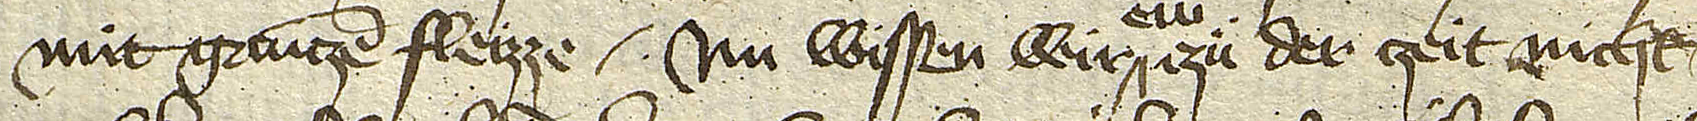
mit gancʒe fleiʒʒe / . Nu wiſſen wie cʒü der cʒeit nicht
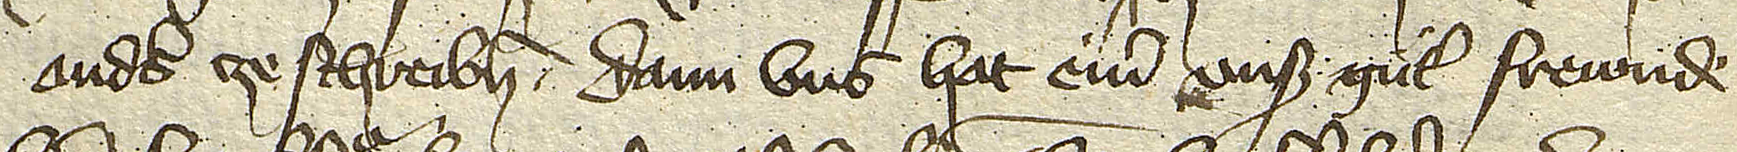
ands* cʒe ſchreibn* / Dann vns hat ein* vnſ* güt* frewnde
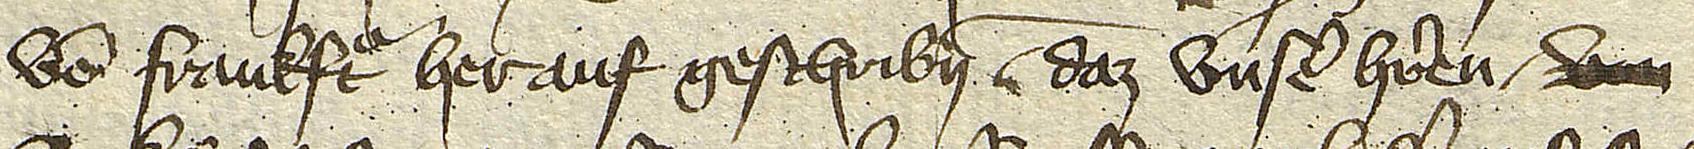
vo* frankf*t her auf geſchribn* / daʒ vnſe* hr*en / von
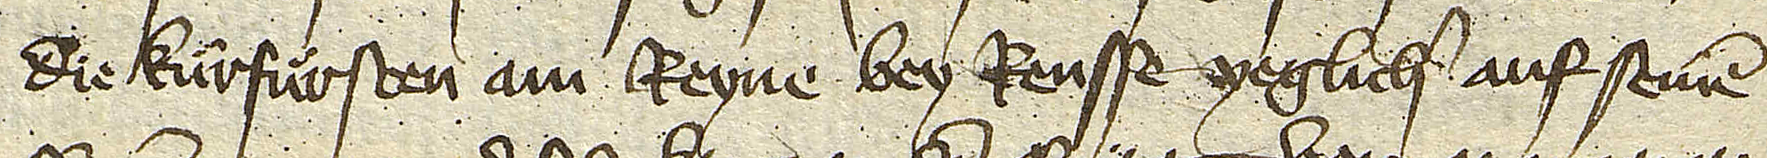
die kürfürſten am Reyne bey Reuſſe yeglich* auf ſeine*
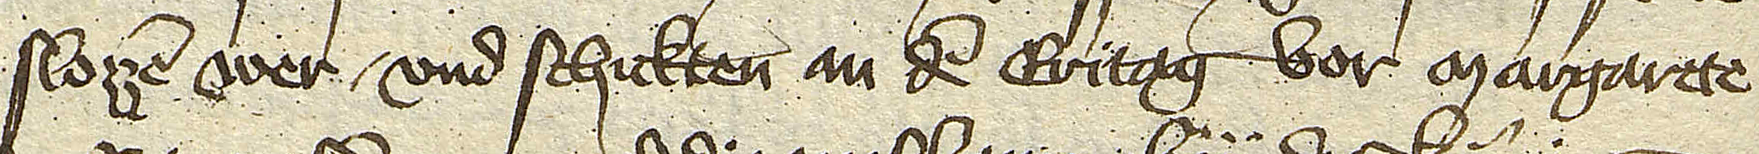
ſloʒʒe* wer / vnd ſchickten an d* Eritag vor Margarete
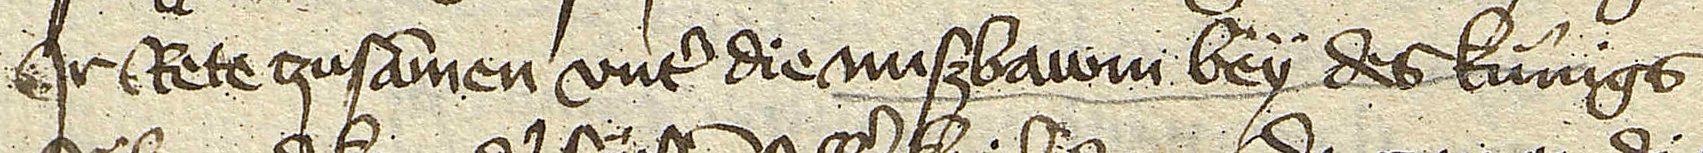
Ir Rete cʒuſamen vnt* die nuſʒbawm bey des künigs
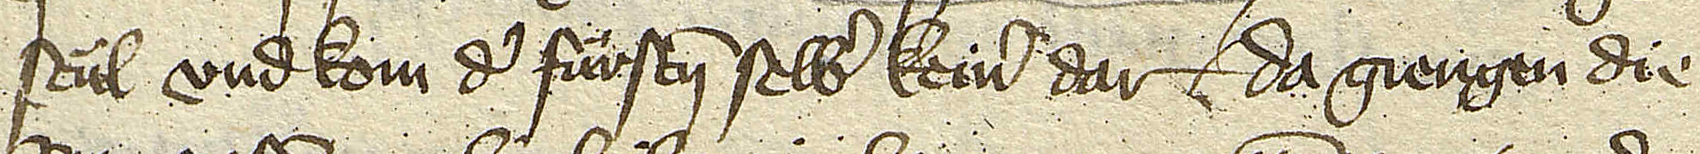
ſtül vnd kom d* fürſtn* ſelb* kein* dar / da giengen die
